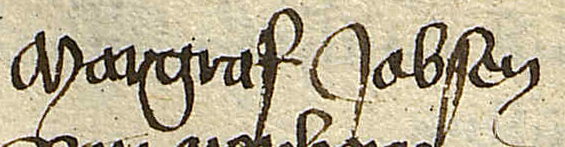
Margraf Iobſen
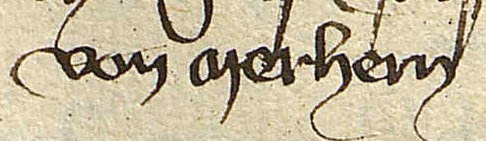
von Merhern
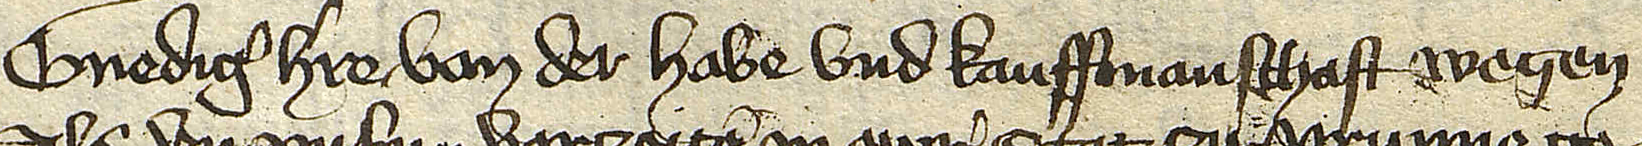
Gnedig* h*re / von der habe vnd kauffmanſchaft wegen
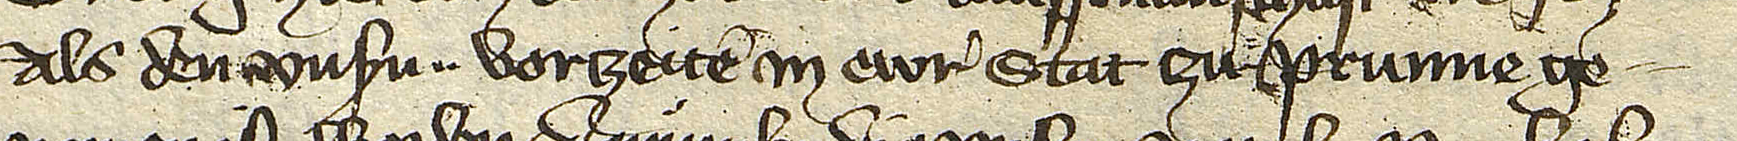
Als den vnſ*n ~ vorcʒeite* in ewr* Stat cʒu Prunne ge =
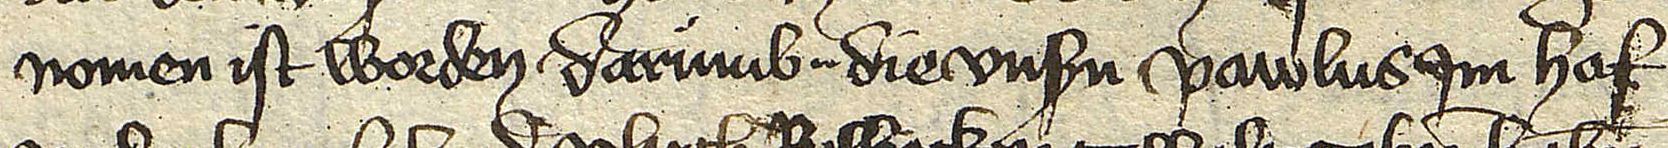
nomen iſt worden / Darümb ~ die vnſ*n Pawlus Im hof
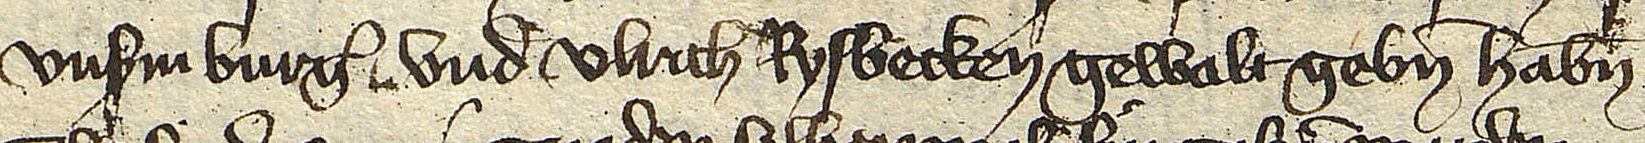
vnſ*m burg* vnd vlrich Ryſbecken gewalt gebn* habn*
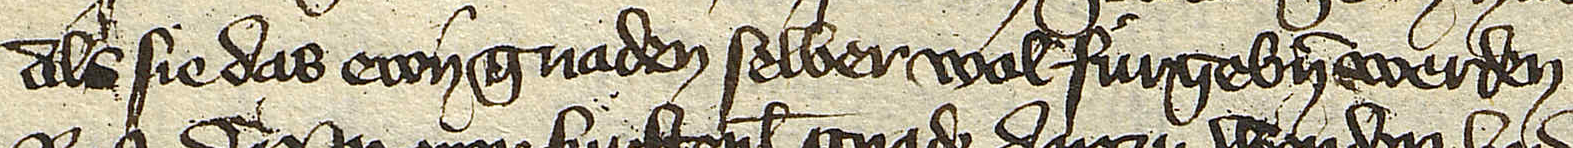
Als ſie ewn* gnaden ſelber wol fürgebn* werden
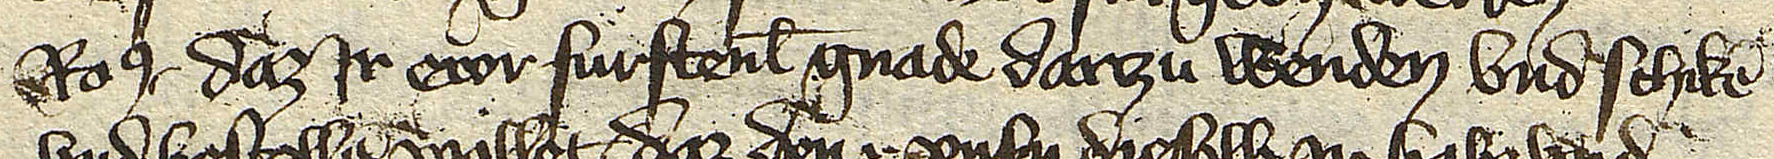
Ro* / daʒ Ir ewr fürſtenl* gnade darcʒu wenden vnd ſchike*
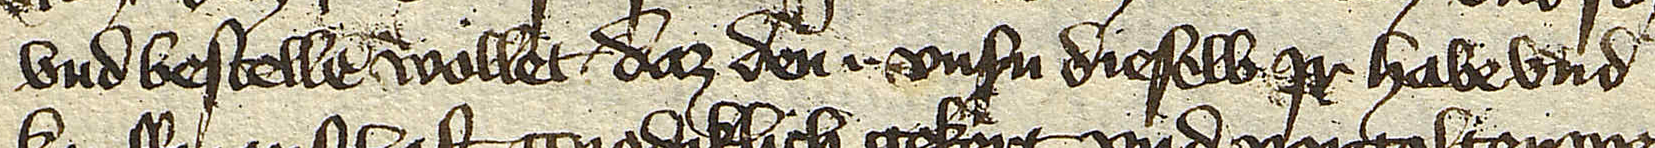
vnd beſtelle* wöllet / daʒ den ~ vnſ*n dieſelb Ir habe vnd
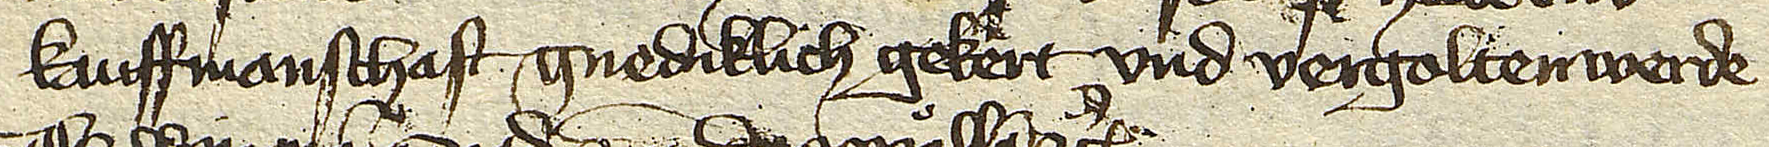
kauffmanſchaft gnediklich gekert vnd vergolten werde
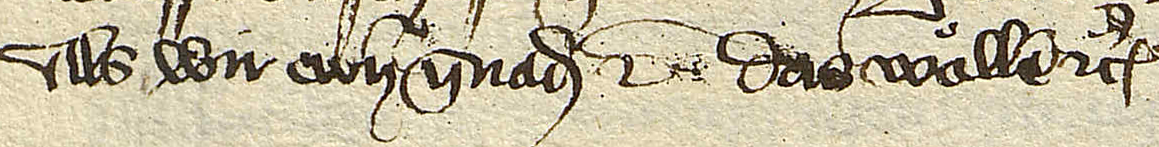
Als wir ewn* gnad* ec* das wölle* ec*
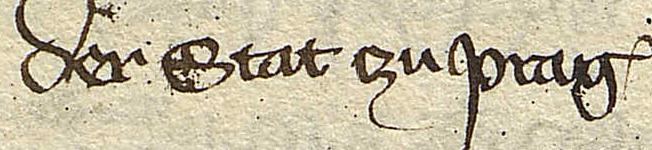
Der Stat cʒu Prag
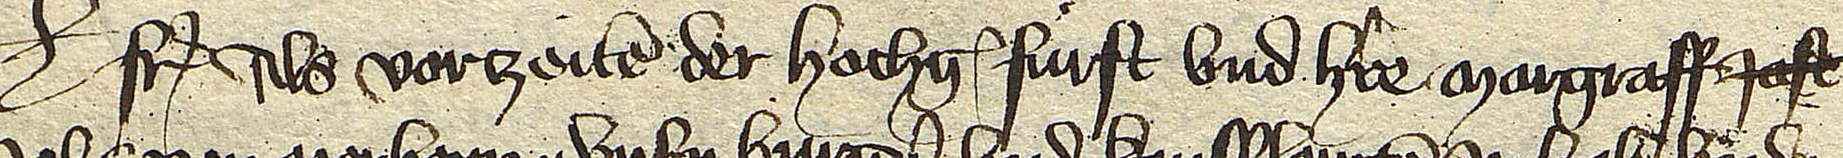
L* fr* Als vorcʒeite* der hochg* fürſt vnd h*re Margraff Ioſt
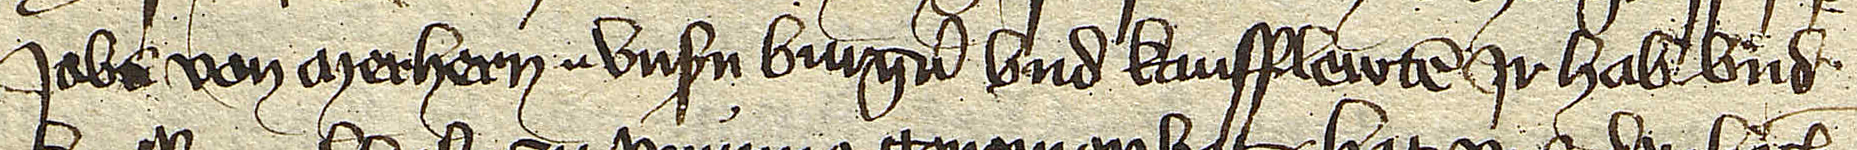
Iobs von Merhern ~ vnſ*n burgn* vnd kaufflewte* Ir hab vnd
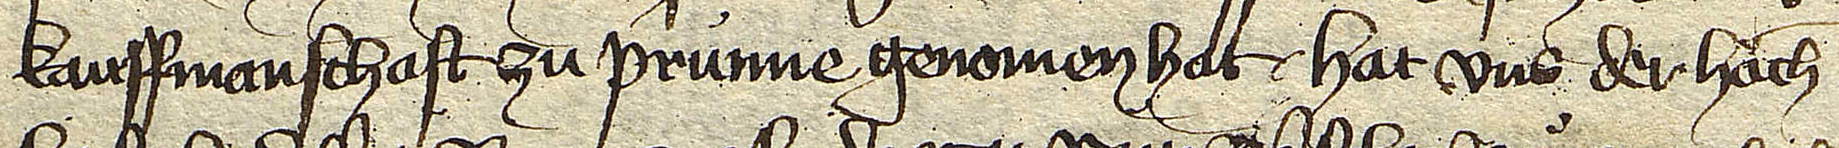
kauffmanſchaft cʒu Prünne genomen hat / hat vns der hoch*
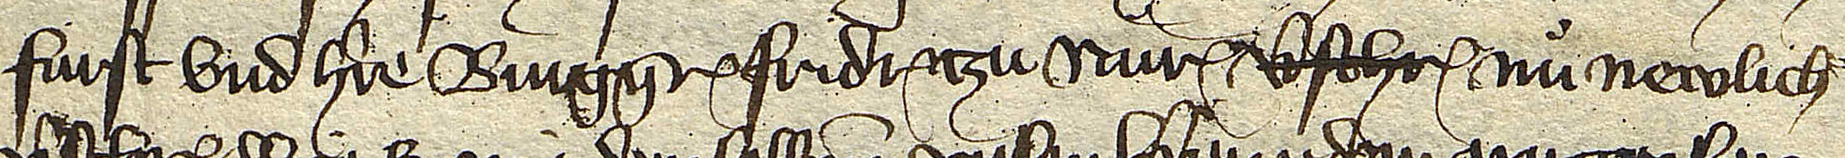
fürſt vnd h*re Burggr* fridr* cʒu Nür* v*ſchr* nü newlich
